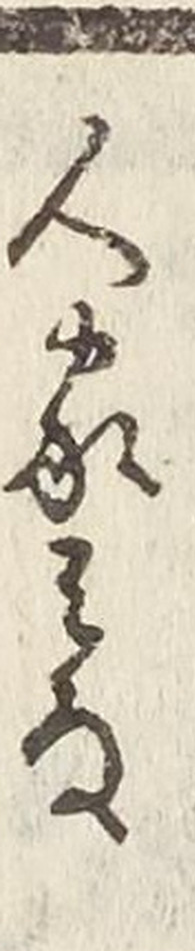人家みな
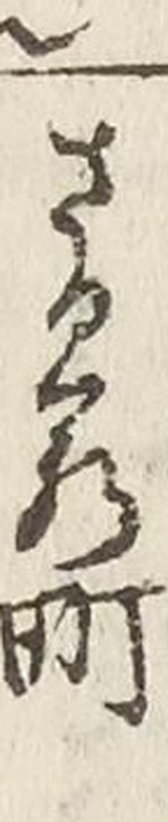さる若町
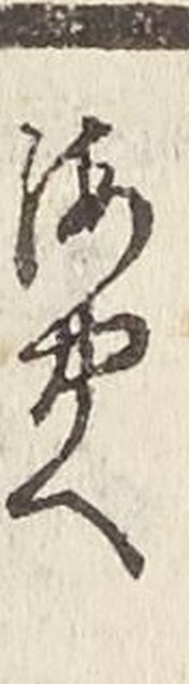海中へ
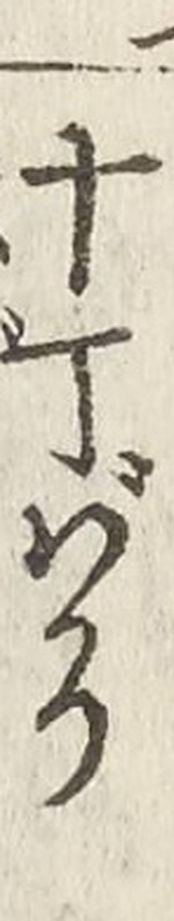十丁ばかり
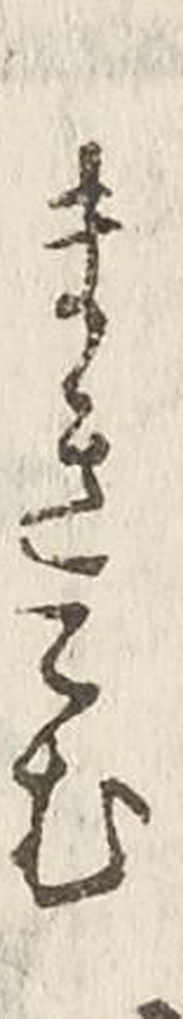まきこむ
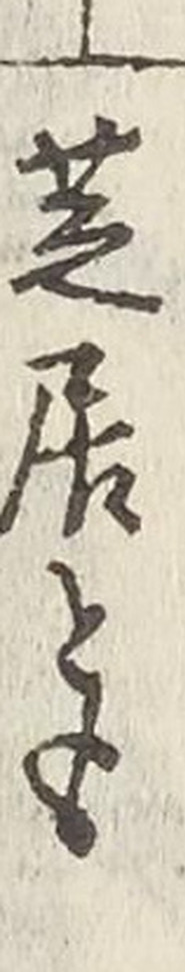芝居とも
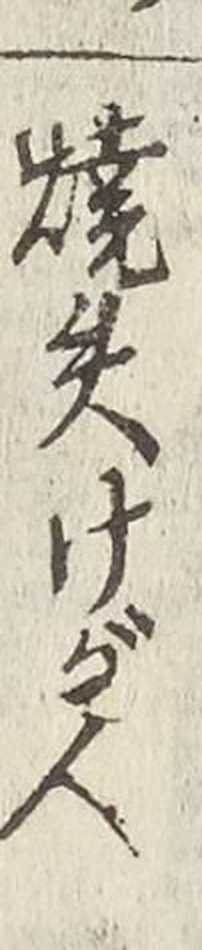焼失けが人
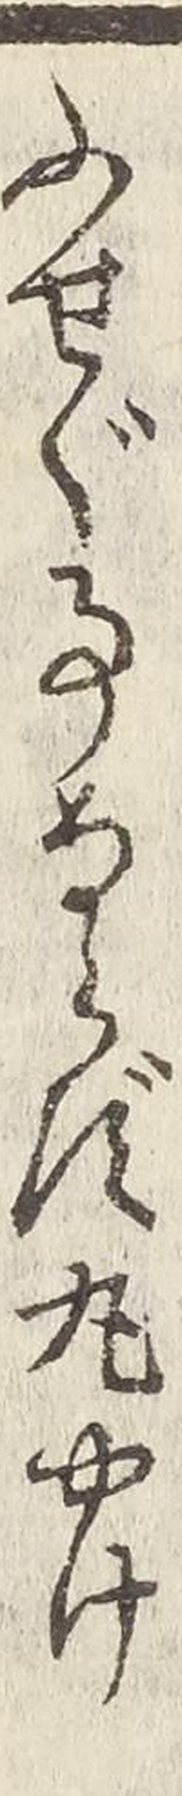ふせぐ事ならず丸やけ

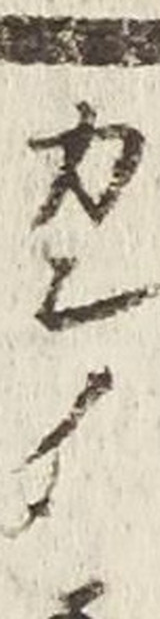カンノ
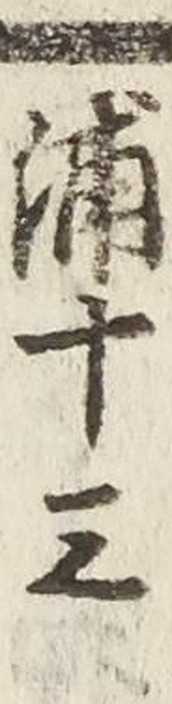浦十三
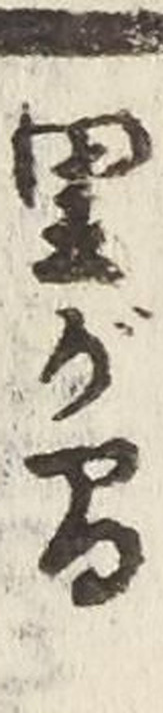里が間
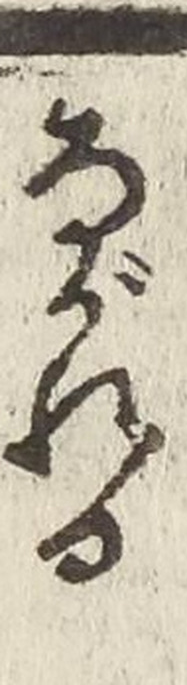ながれる
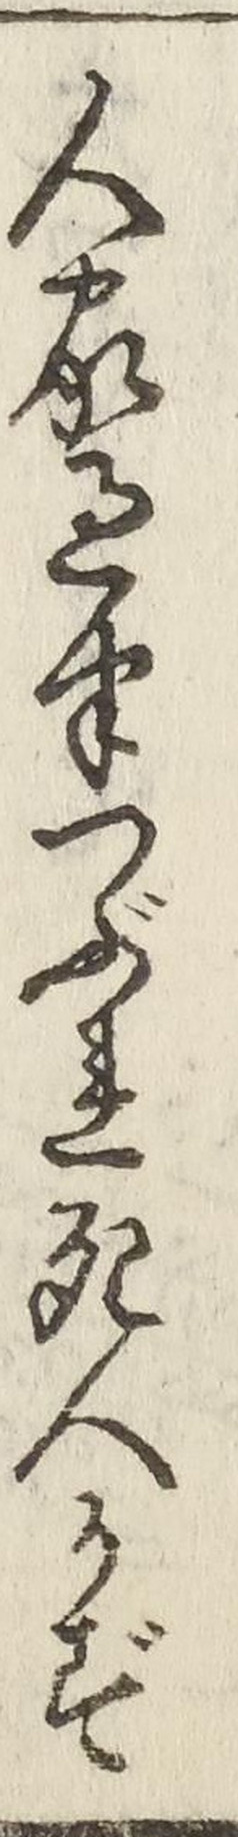人家過半つぶれ死人かず
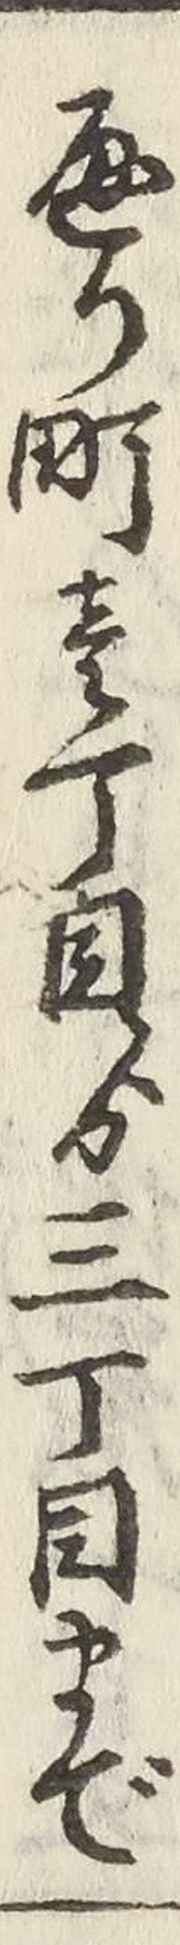通り町壱丁目より三丁目まで
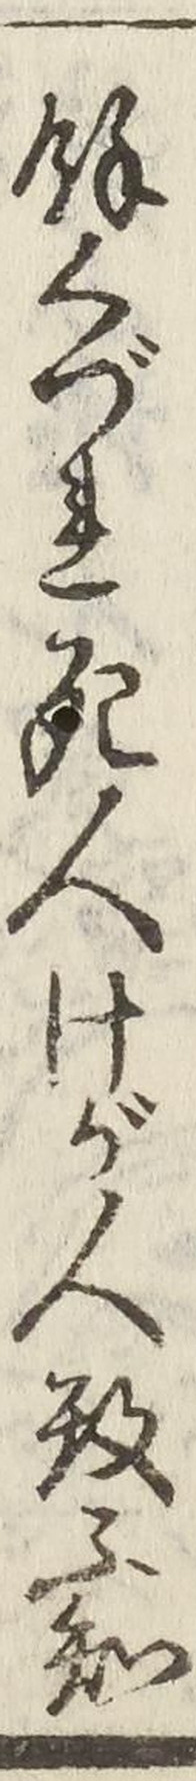余くづれ死人けが人数不知
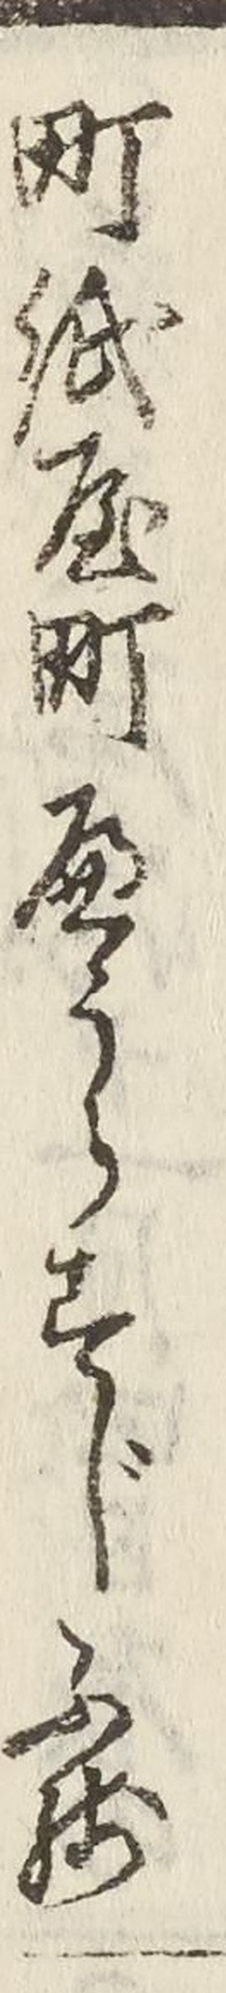町紙屋町へうらすじ不残
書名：大地震大津浪末代噺種　（二編　全）
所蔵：東京大学地震研究所図書室 Earthquake Research Institute Library, The University of Tokyo, JAPAN
